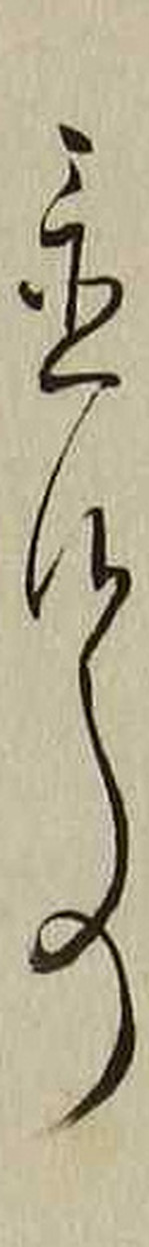置候事
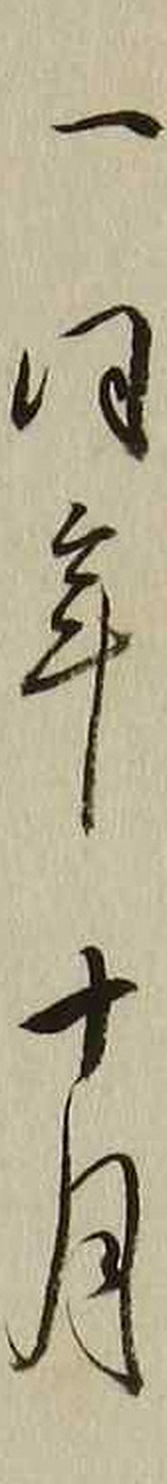一同年十月
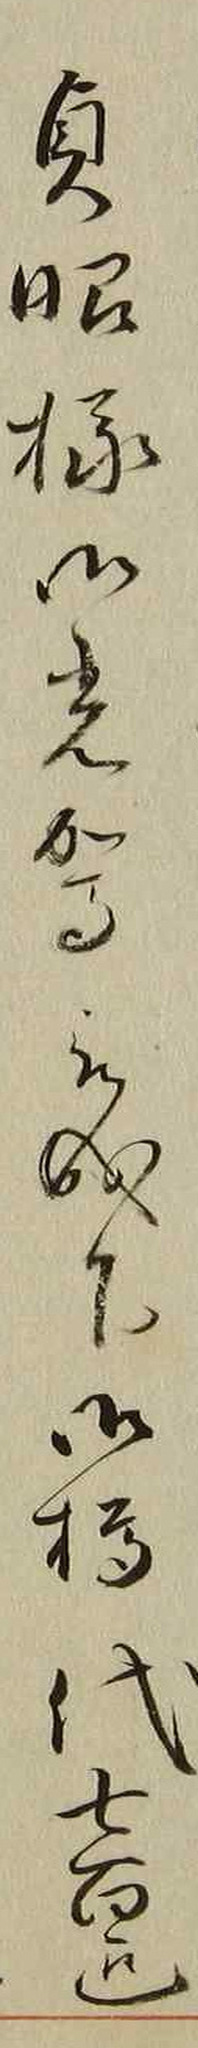貞昭様御光駕被成下御樽代七百匹
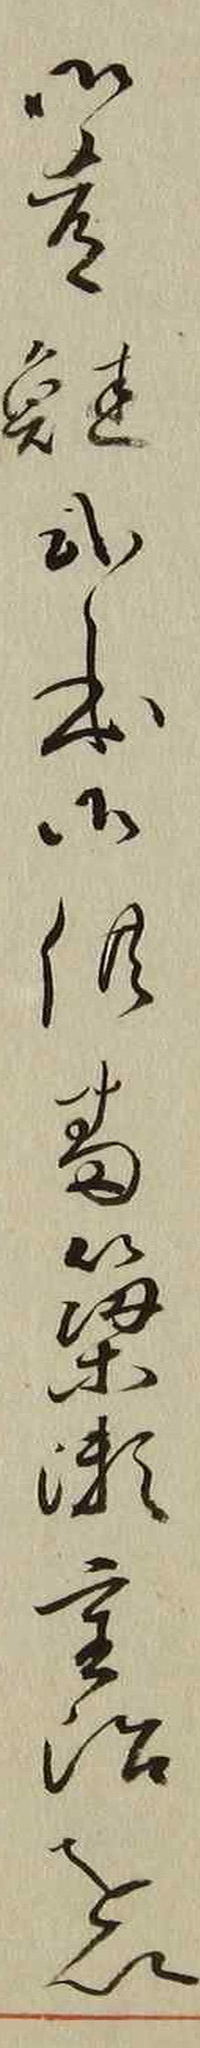御肴鮭弐本御供番簗瀬重治を以
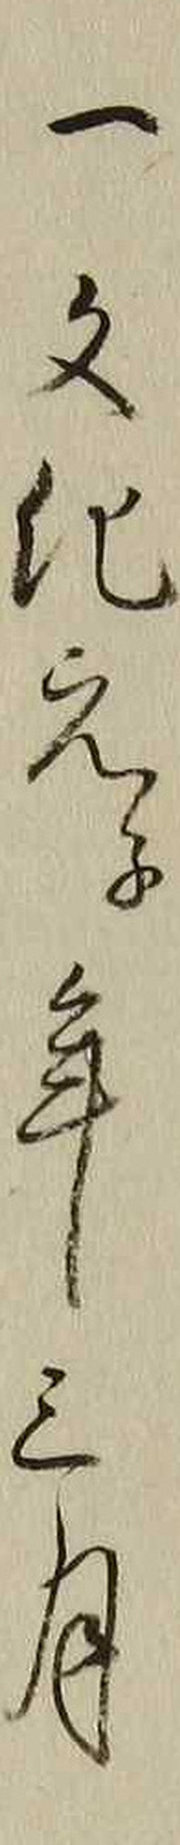一文化元子年三月
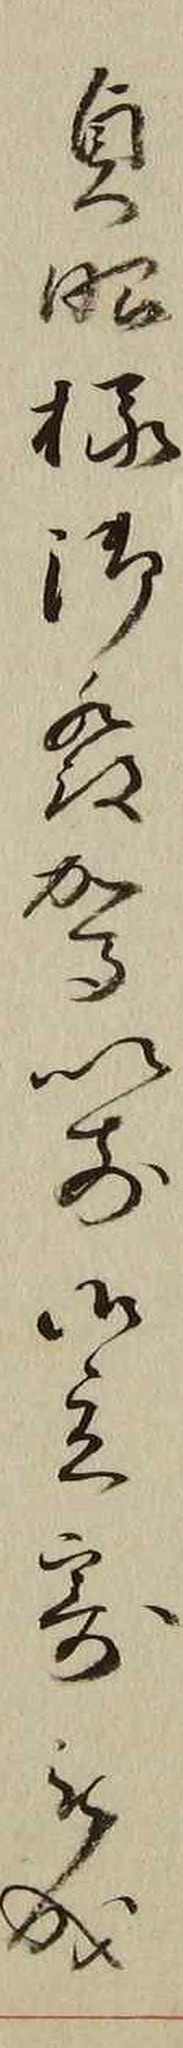貞昭様御発駕以前御立寄被成
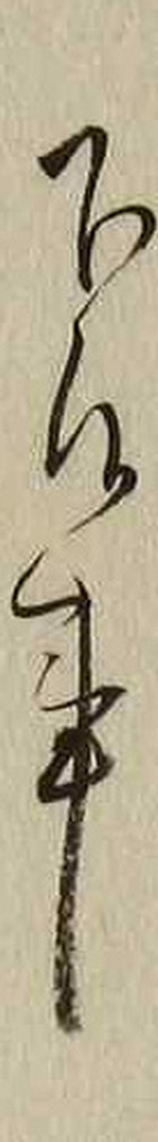下候事
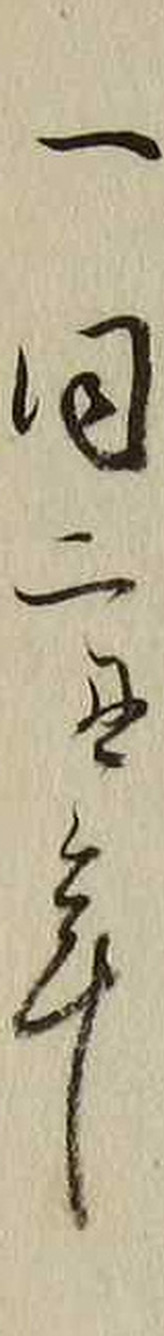一同二丑年
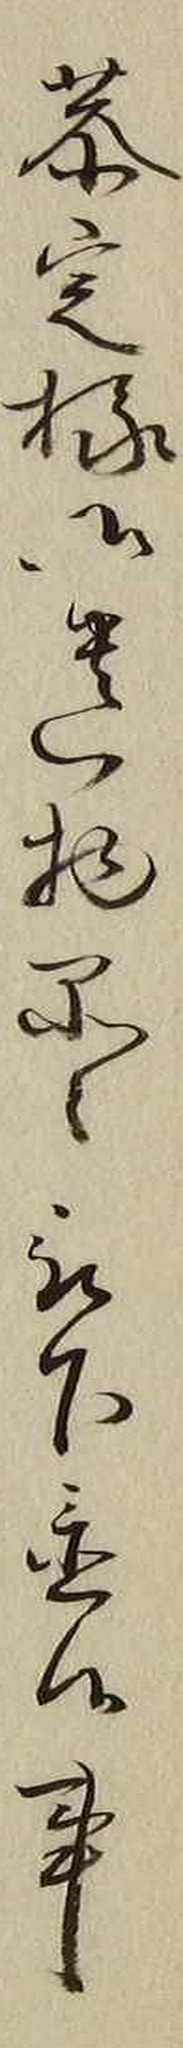恭定様御遺物品々被下置候事
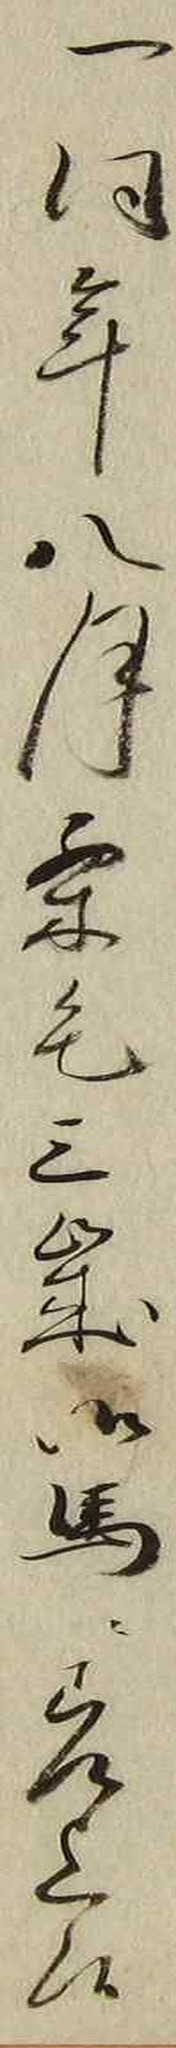一同年八月栗毛三歳御馬ニ差上候
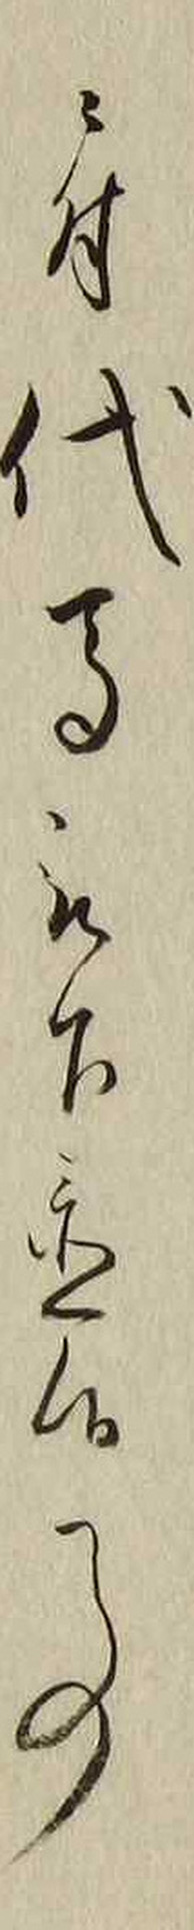ニ付代馬被下置候事
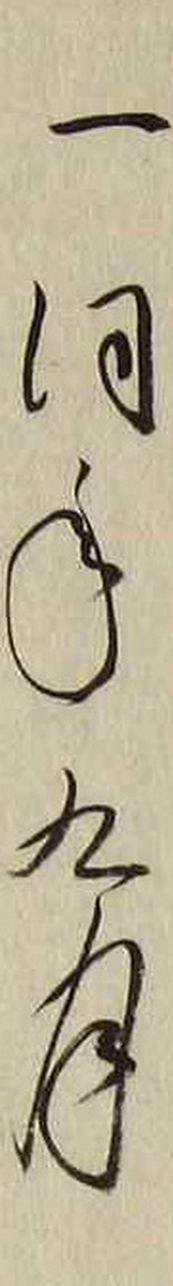一同年九月
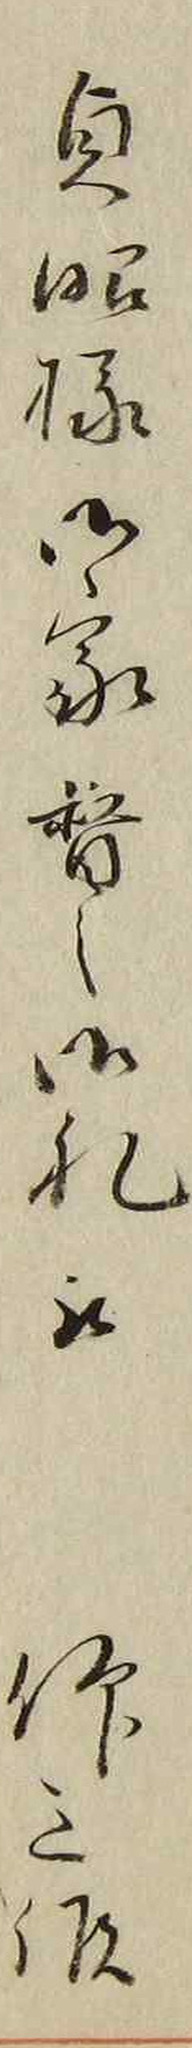貞昭様御家督之御礼被仰上候

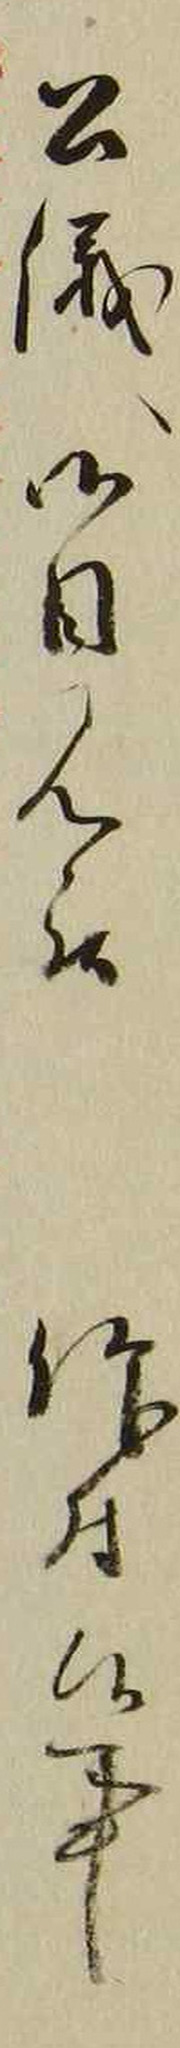公儀へ御目見被仰付候事
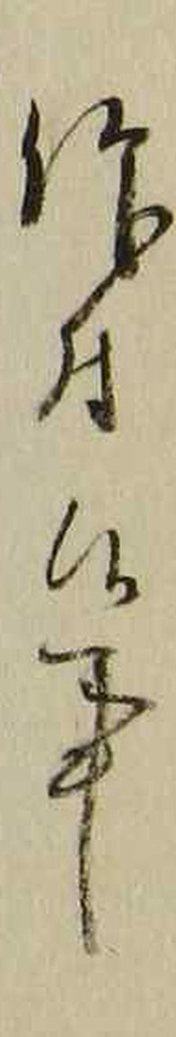仰出候事
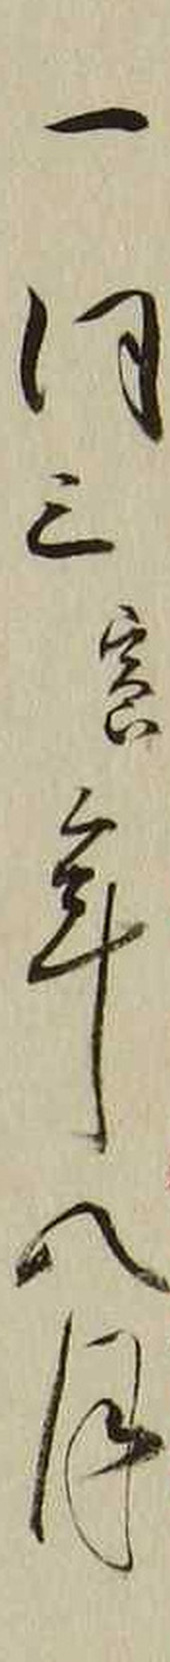一同三寅年八月
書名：諸士系譜　巻之2　い之部2
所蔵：会津若松市立会津図書館
